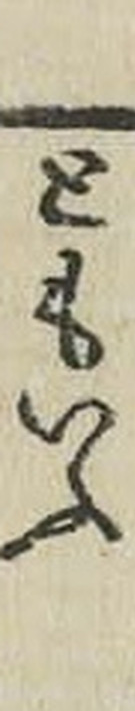ともいふ
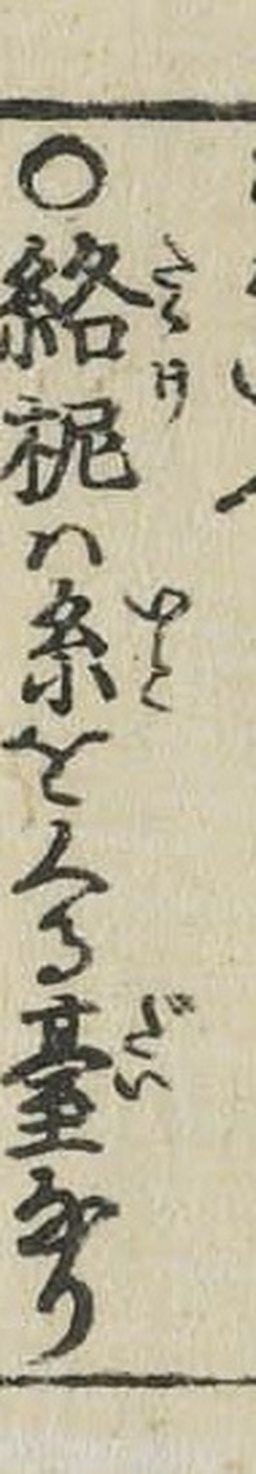○絡柅は糸をくる台なり
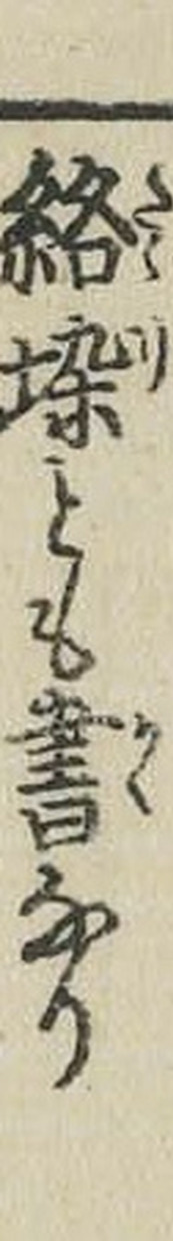絡垜とも書なり
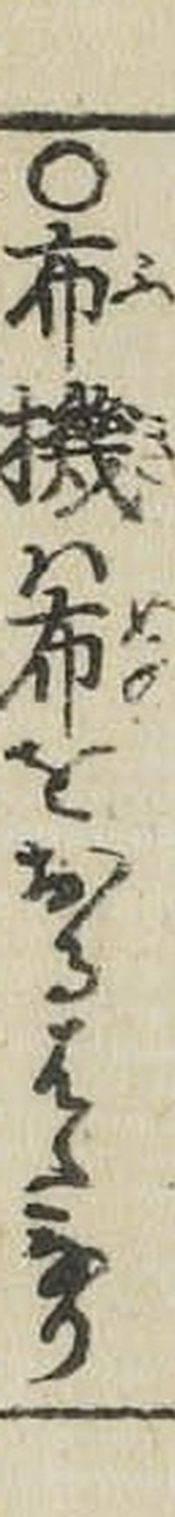○布機は布をおるはたなり
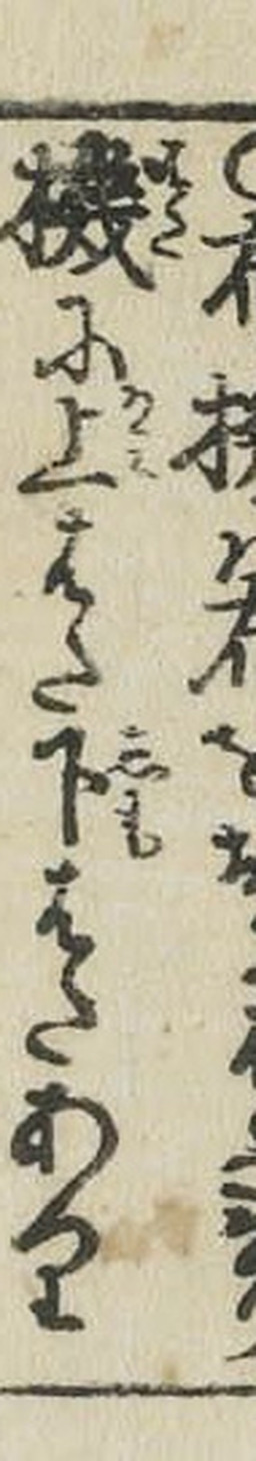機に上はた下はたあり
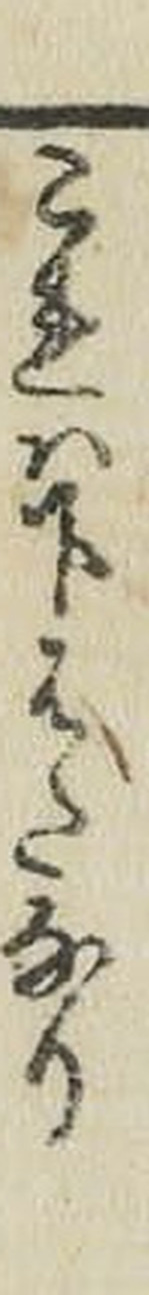これは下はたなり
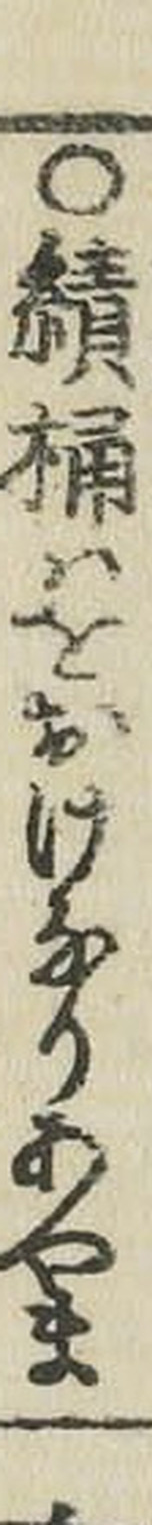○績桶はをおけなりあやま
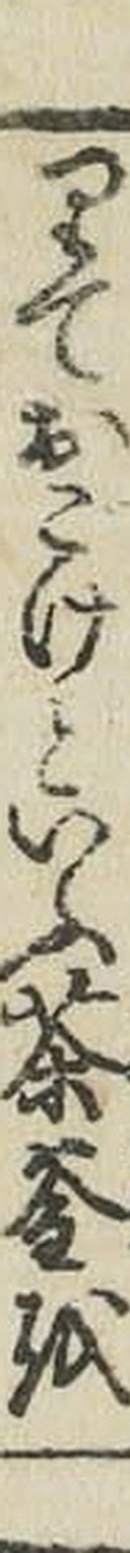りておごけといふ茶釜を
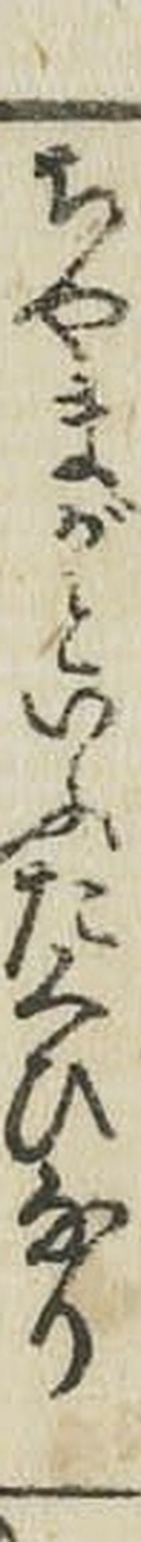ちやまがといふたくひなり
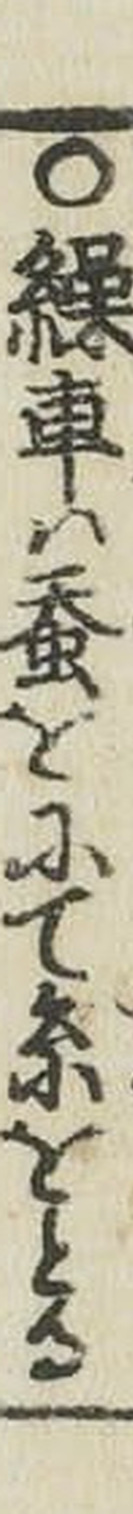○繰車は蚕をにて糸をとる
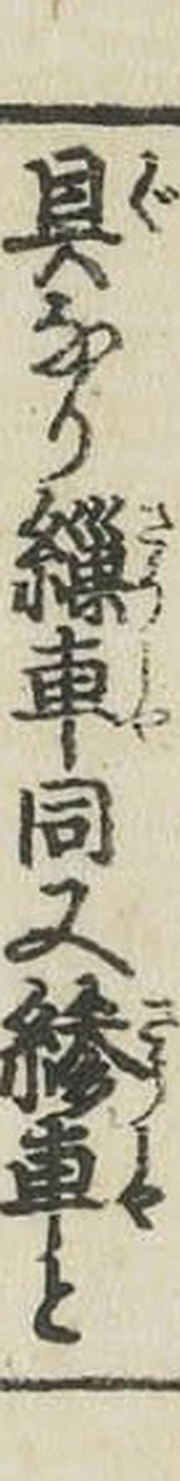具なり繅車同又縿車と
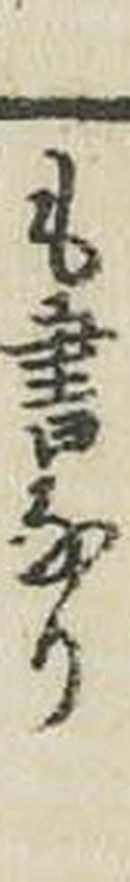も書なり
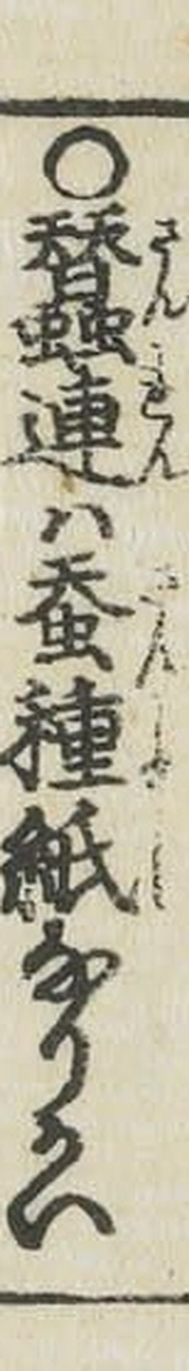○蠶連は蚕種紙なりかい
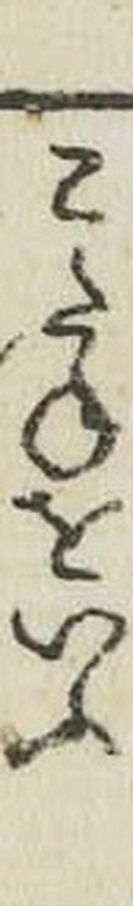こたねをいふ
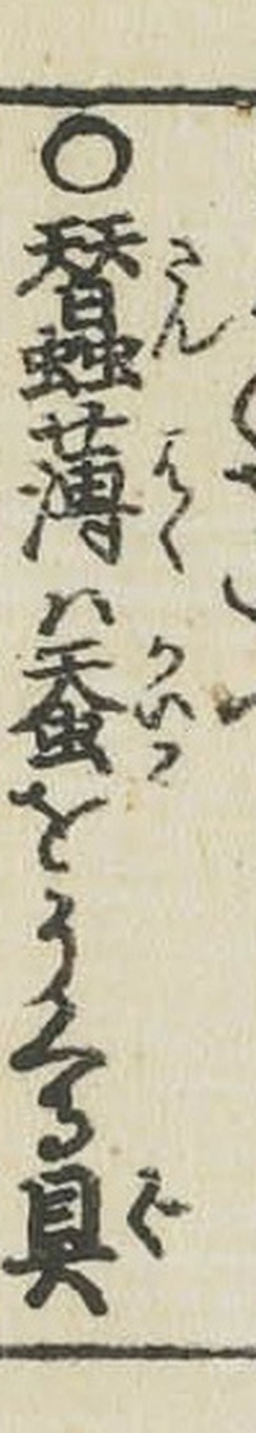○蠶薄は蚕をうくる具
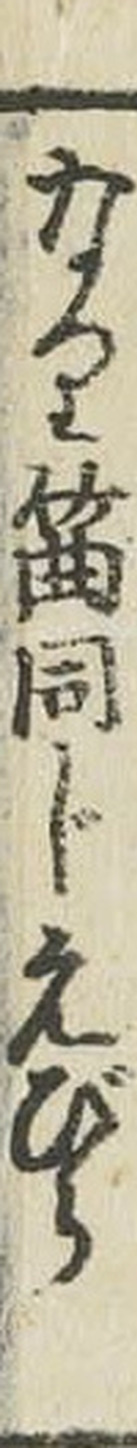なり筁同じえびら
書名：増補頭書訓蒙図彙大成 10巻 5:巻之9-11
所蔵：東京学芸大学教育コンテンツアーカイブ
